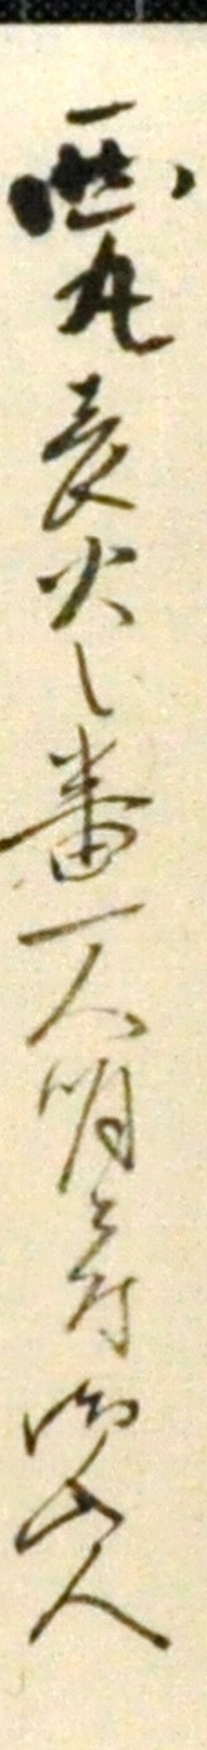西丸表火之番一人明に付御入人
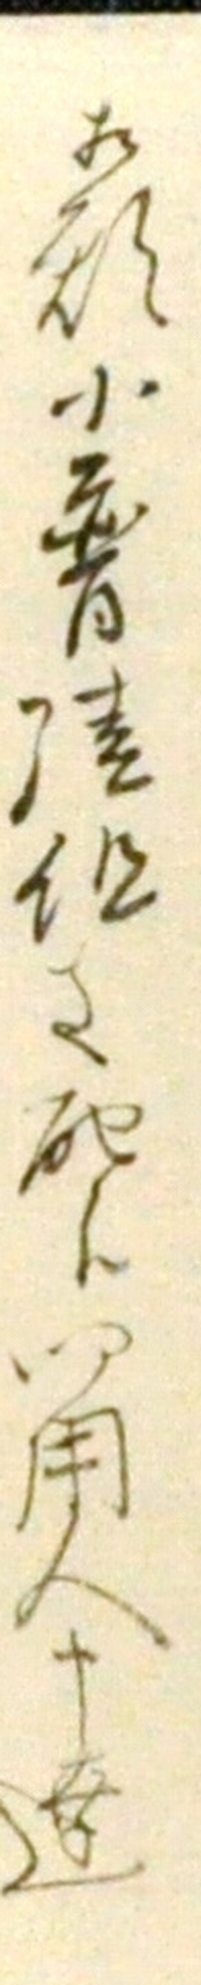相願小普請組支配へ御用人申達
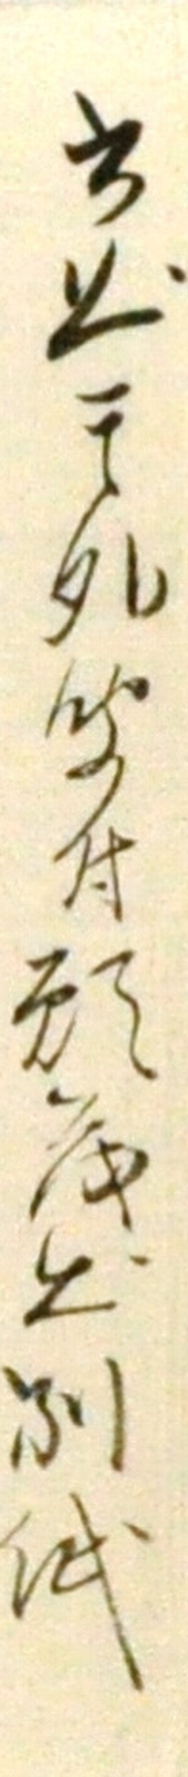書上其外聞付願茂出別紙
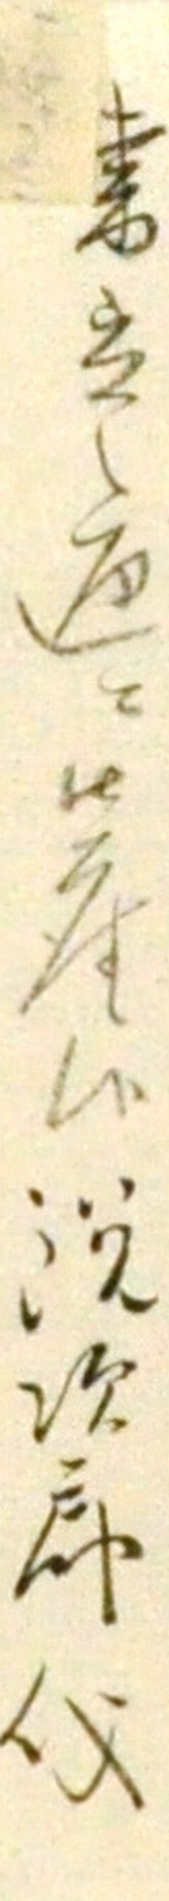書取之通に御座候鋭次郎儀
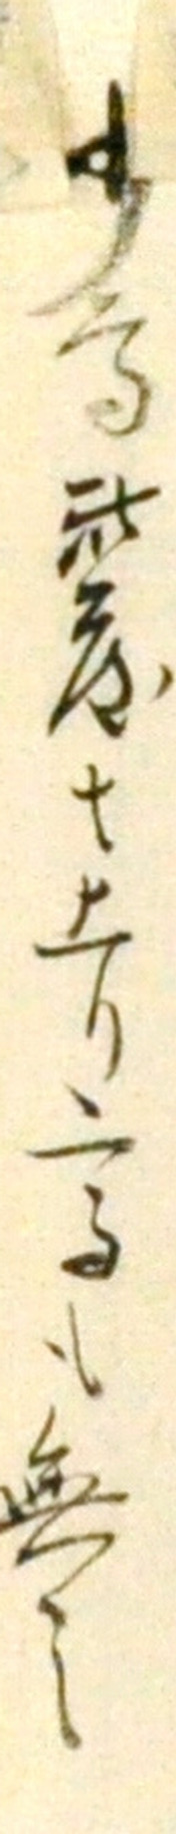少高此度は上り高も無之
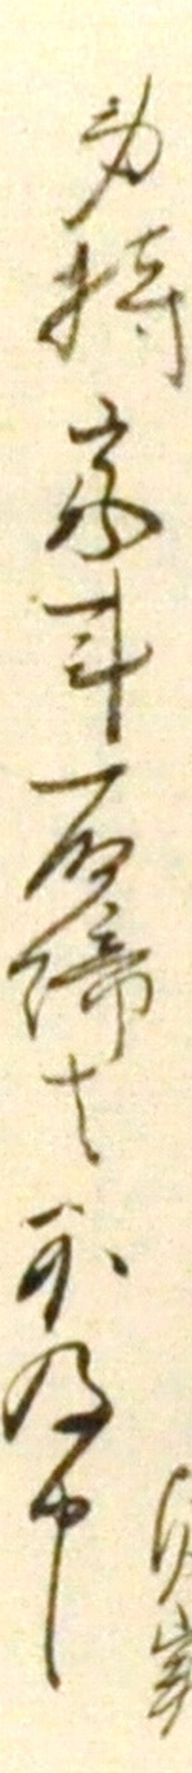身持家斗取締は不及申
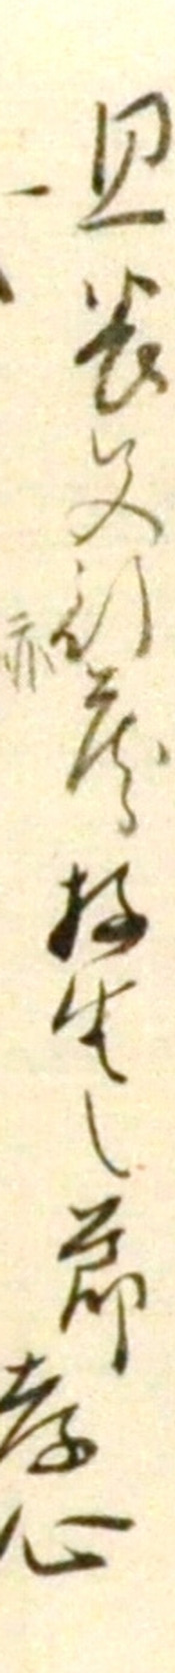且養父行蔵存生之節孝心
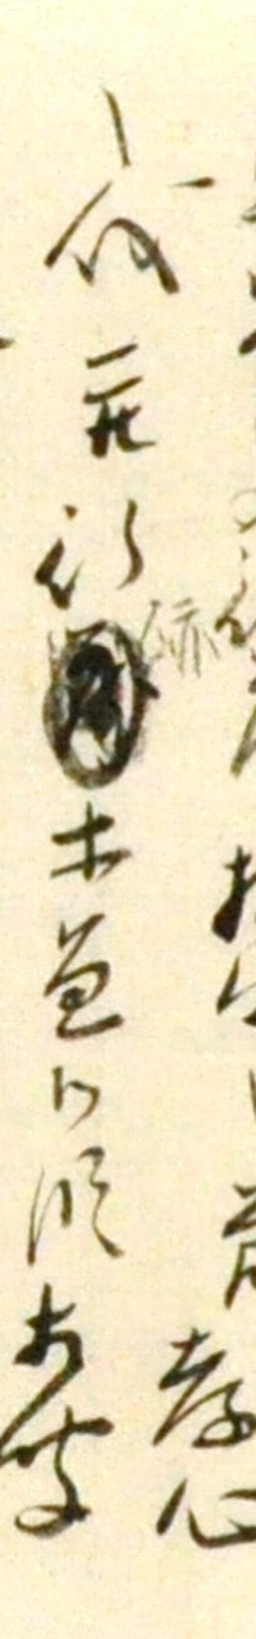之儀并行跡等宜候段相聞
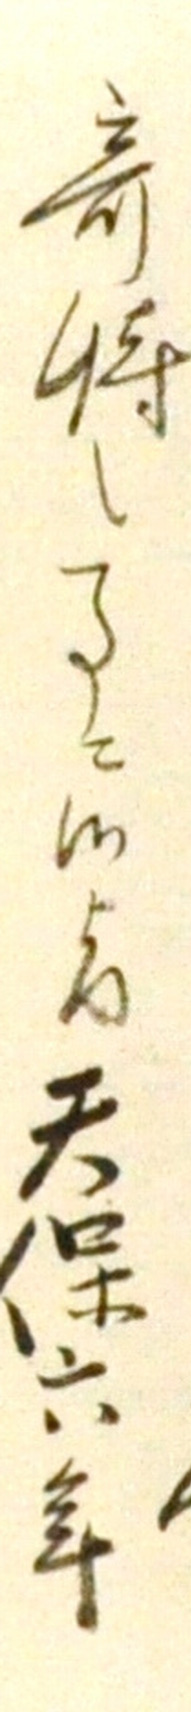奇特之事に候旨天保六年
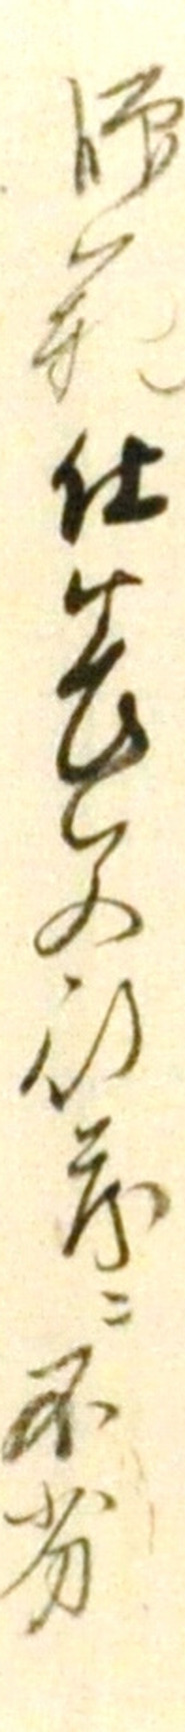師範仕養父行蔵に不劣
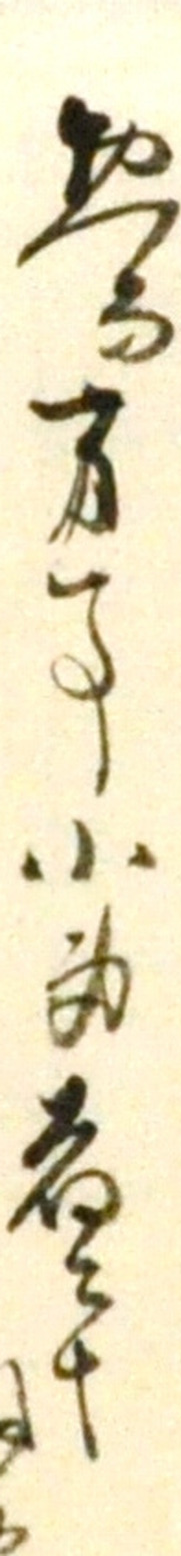勤而万事小身者に者敷
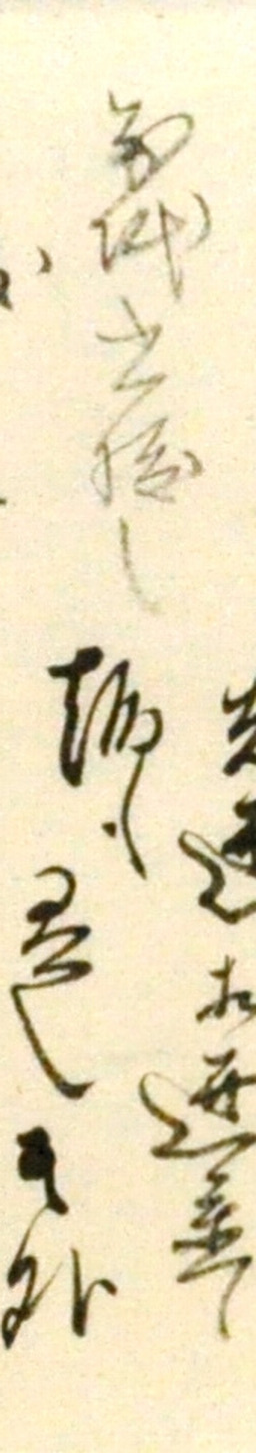別紙書抜趣も有之其外
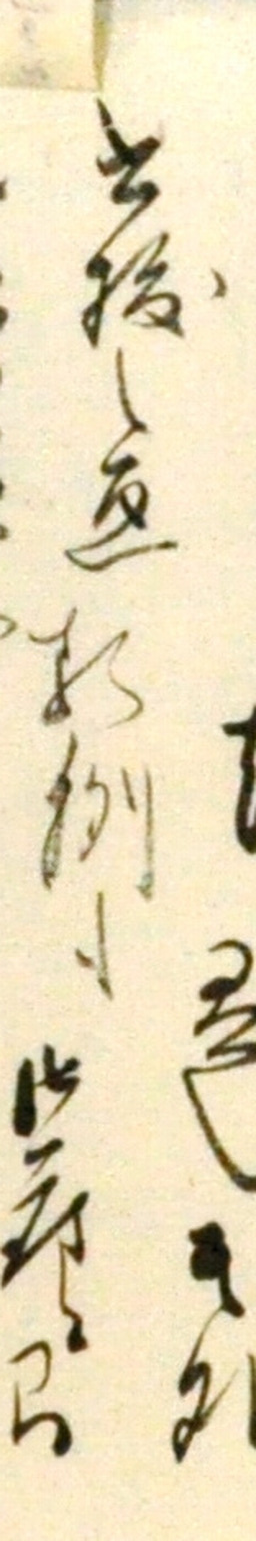書抜之通類例も御座候間
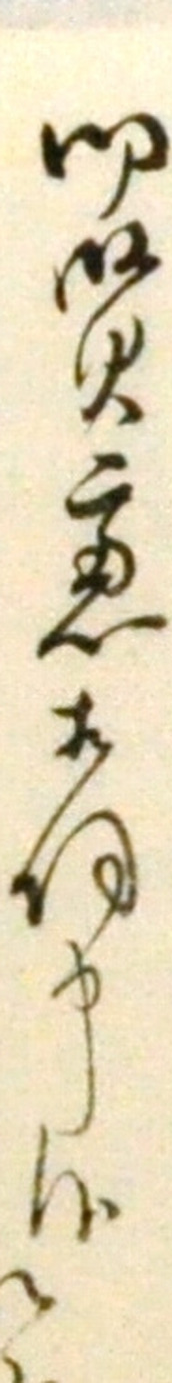御賢慮相伺申候以上
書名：火之番取調候下案文
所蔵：伊那市立高遠町図書館・合同会社AMANE
